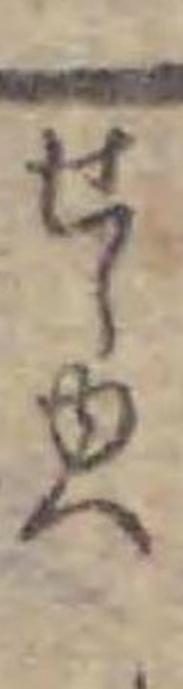せしゆへ
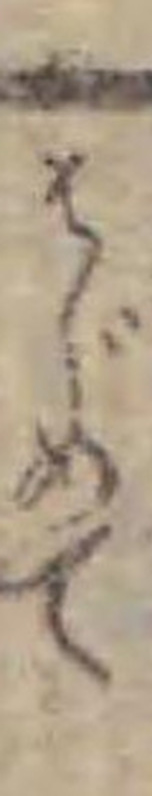はじめて
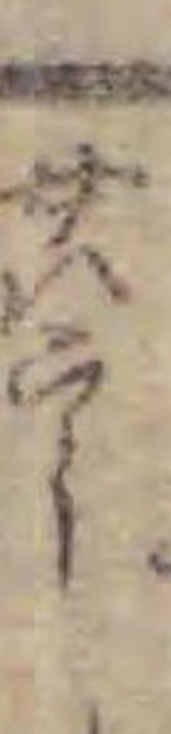女はこう
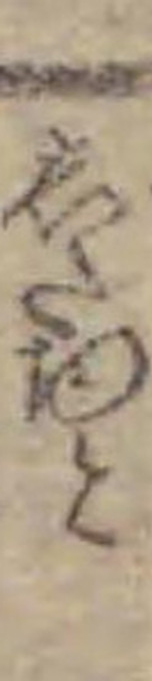した物と
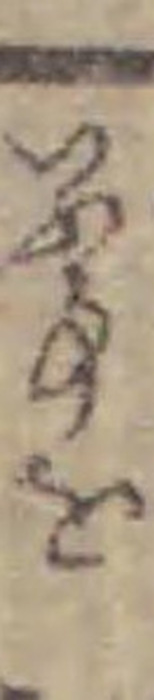いふ事を
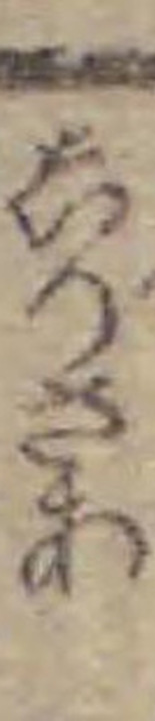しりさあ
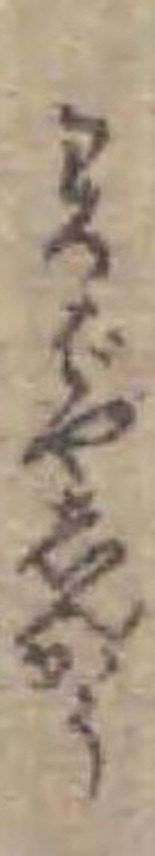わかばやしんかう
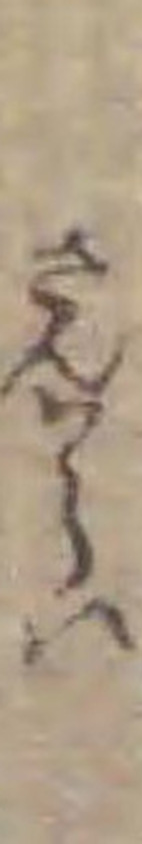さんからは
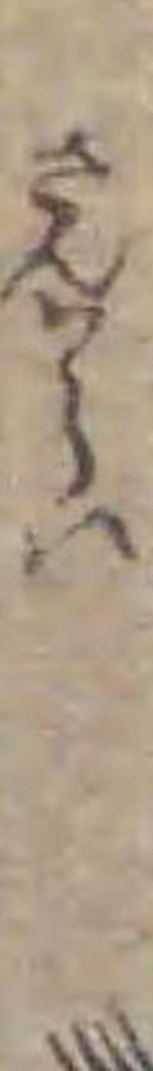さんからは
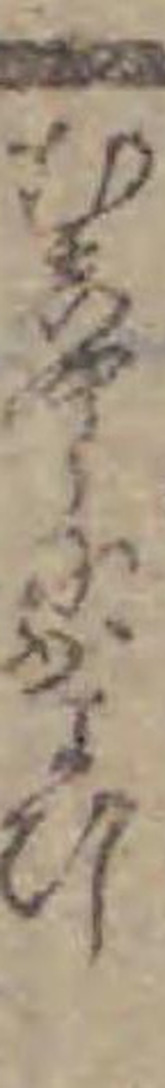むちゆうにかよひし
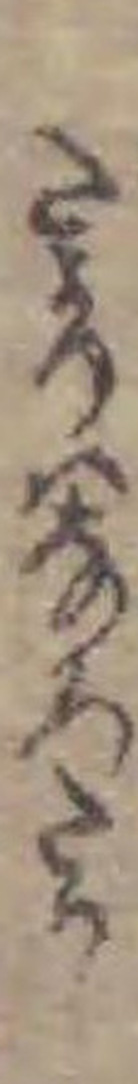たよりはなかつたか
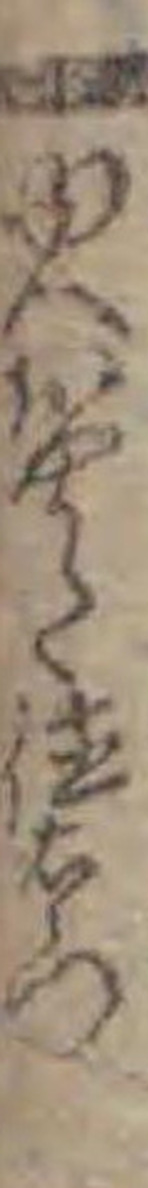ゆへおやかた徳右衛門
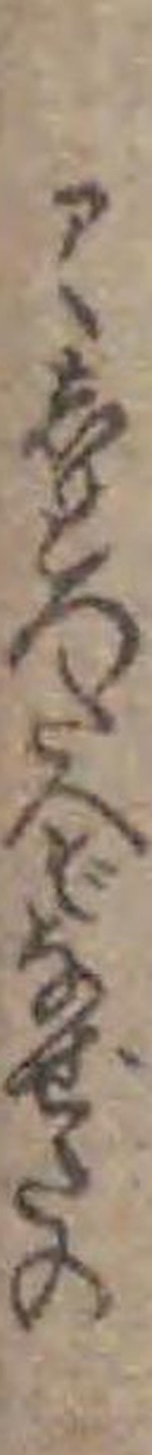アゝしとつたへぞなぜたの
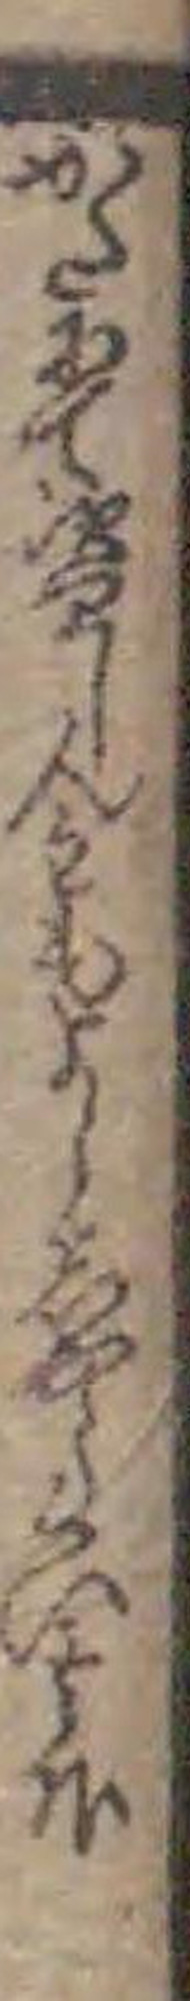かたにて盗し金もしやうらい其外
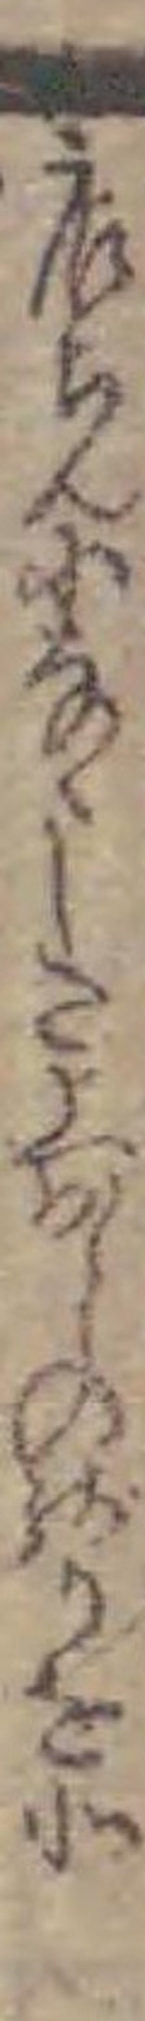店ちんになくした上かしの残りを北
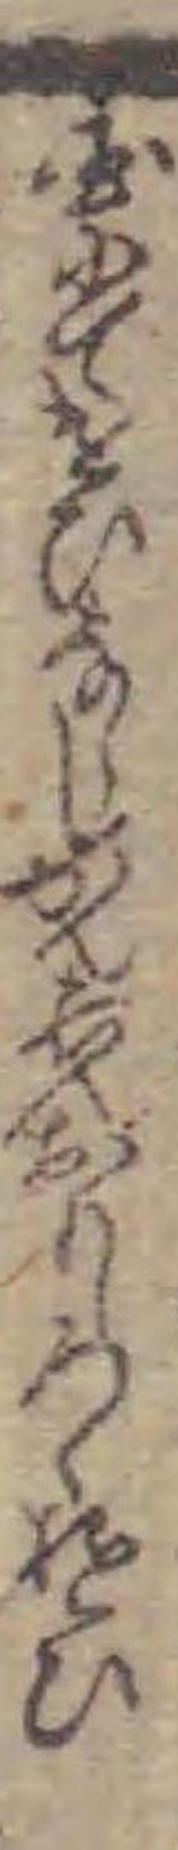国にて遣いならしかん者へおもしろく想ひ
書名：通風伊勢物語 : 3巻
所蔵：国立国会図書館 National Diet Library, JAPAN
